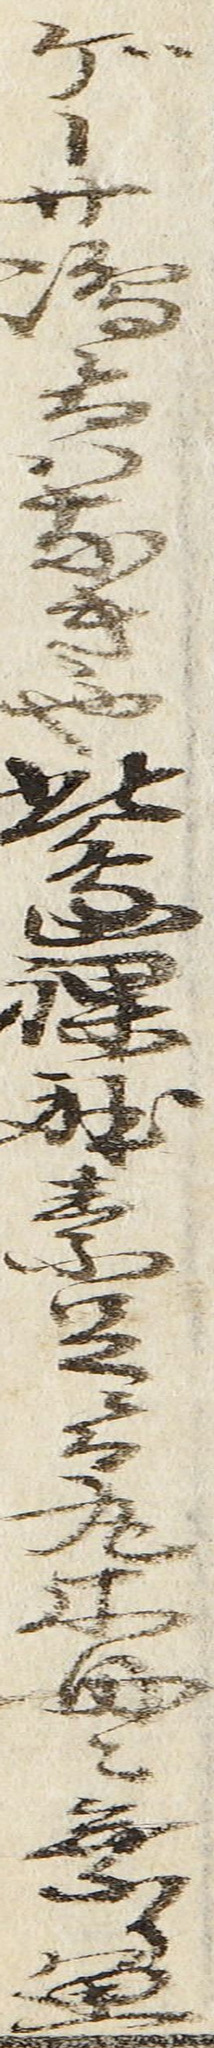ゲーサ島に而はなきや此辺裸体素足に而丸木舟に乗り魚
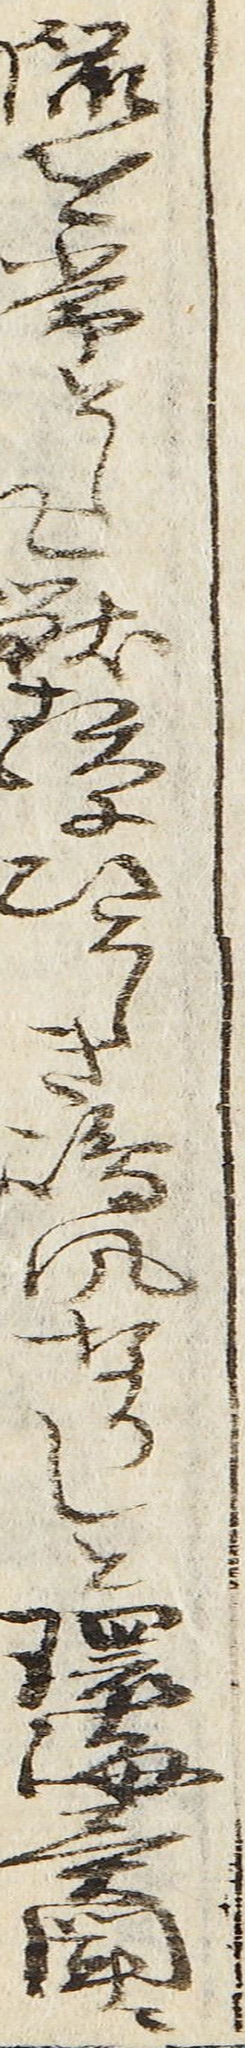猟を常として獣類にひとしき島風なりしと環海異聞に
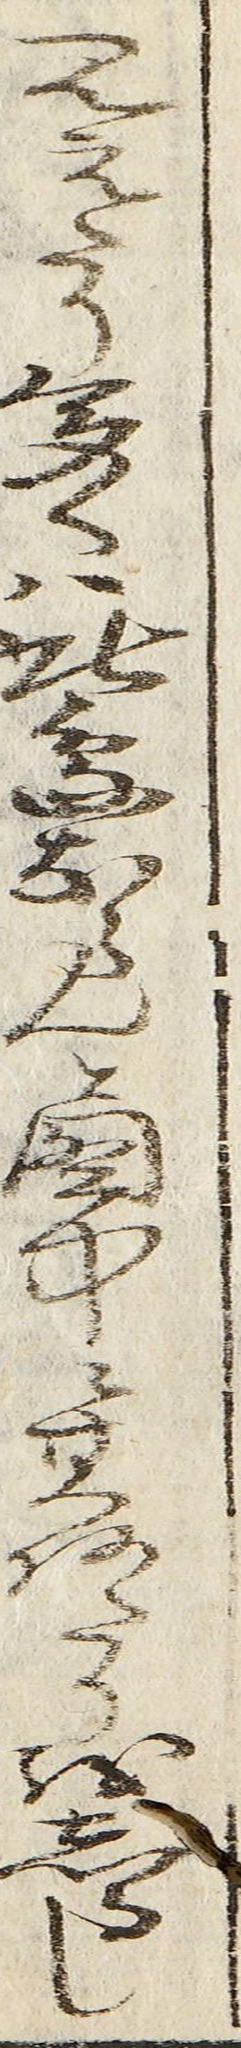見えたり多くは此辺ならんと図中に其あたりをしるし
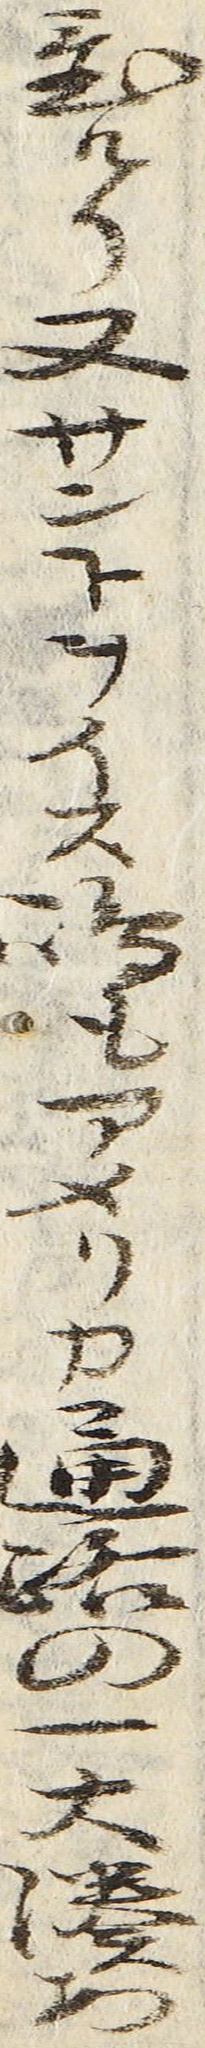置けり又サントヲイス島もアメリカ通路の一大湊あ
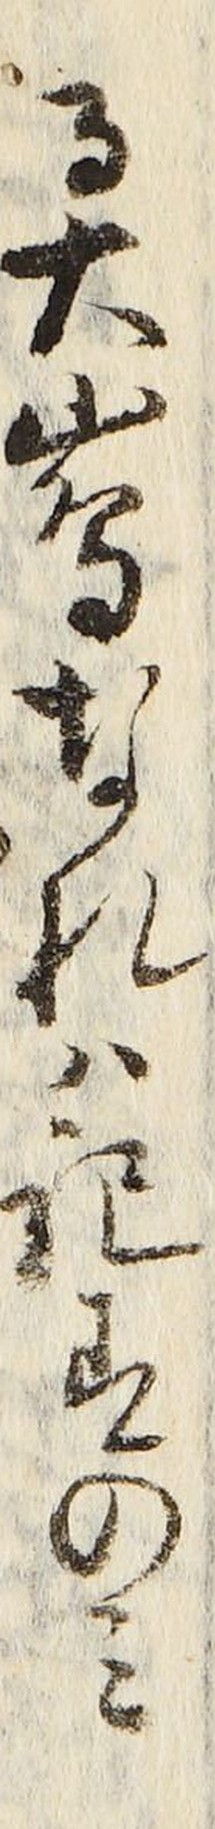る大島なれは記すのみ

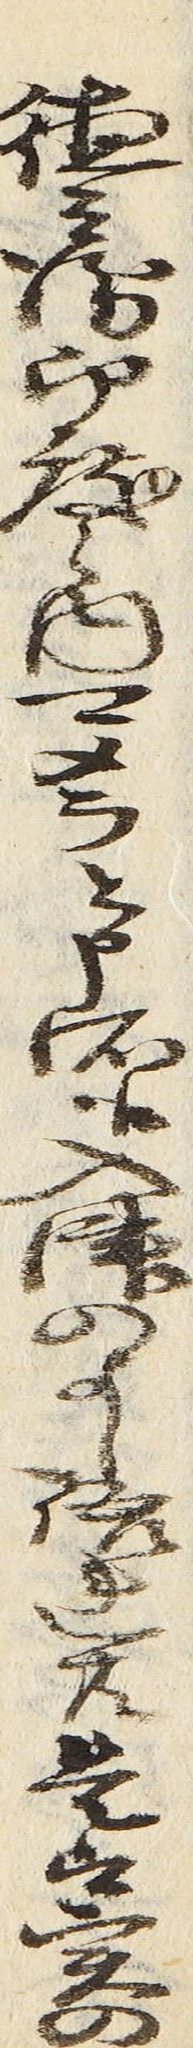一徳兵衛印度之内マメラと申所江入津のよし語れ共是は実の
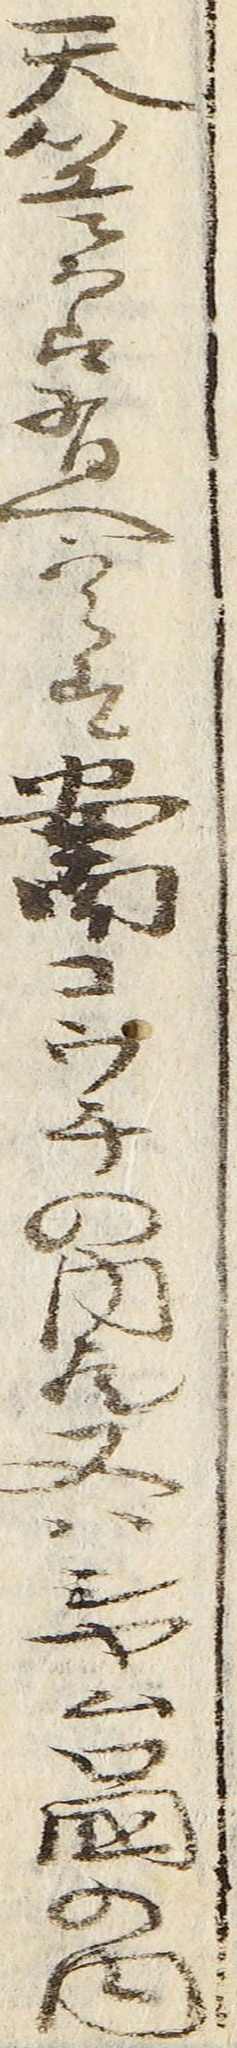天竺に而は有へからす安南コウチの内歟又はシャムロ国の内
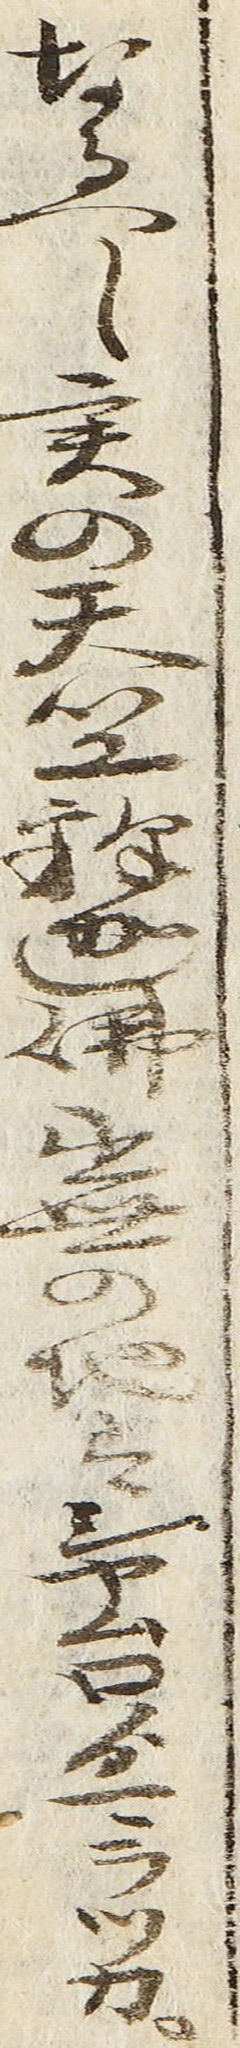なるへし実の天竺釈迦仏出世の地はシャムロゟマラッカ
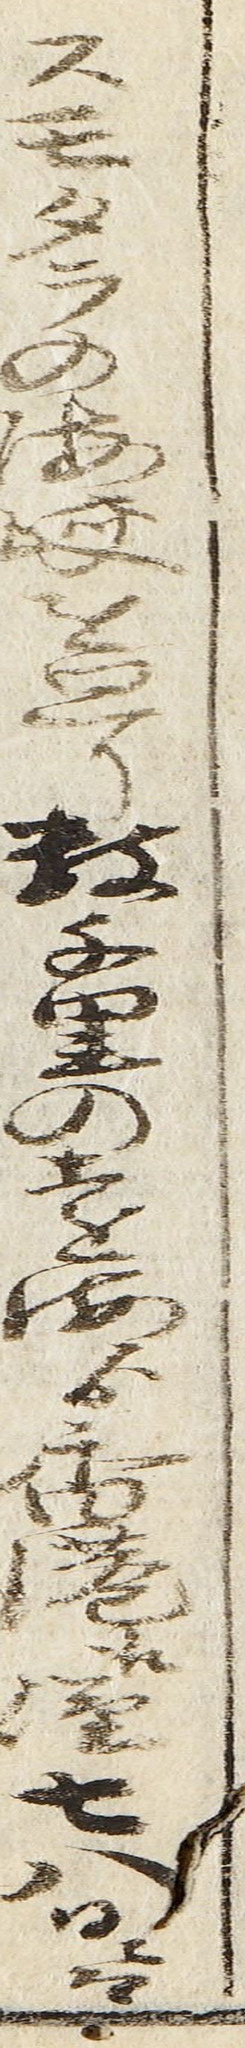スモタラの海峡を廻り数千里の遠海より香港江僅七八日に而
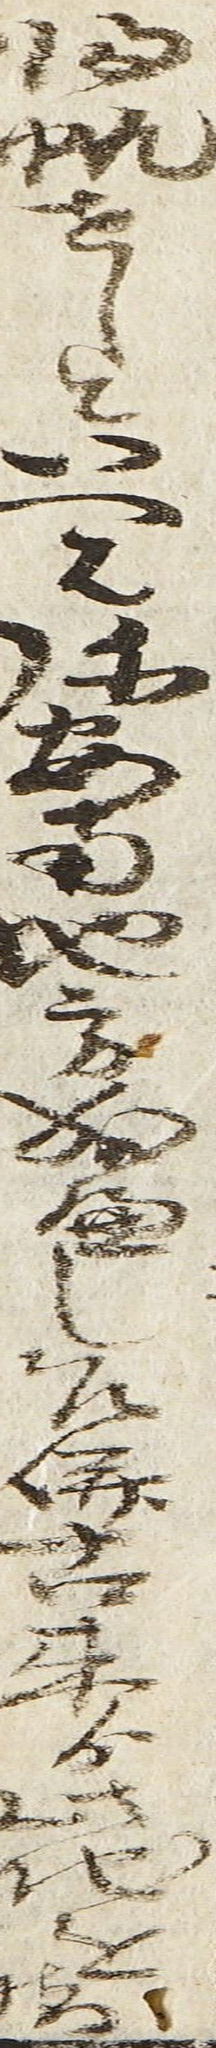帰帆せしといへ者弥安南地方成へし乍併古来ゟ此地を指し
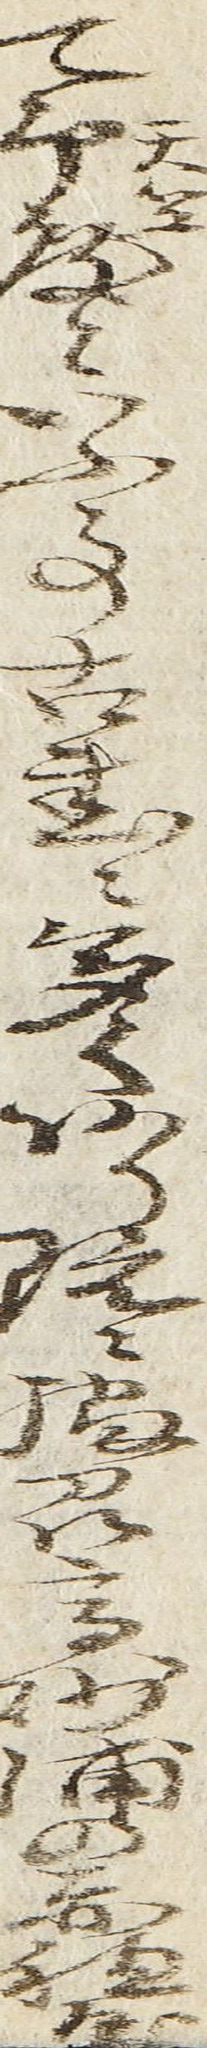て印度といふ事古書に多くあり既に播州高砂浦の赤穂屋
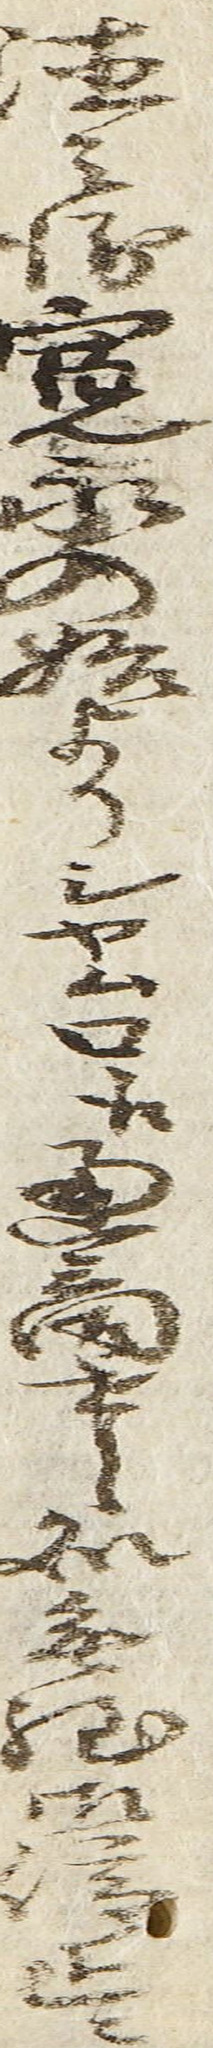徳兵衛寛永の始よりシャムロ江通商せし処無程御停止と
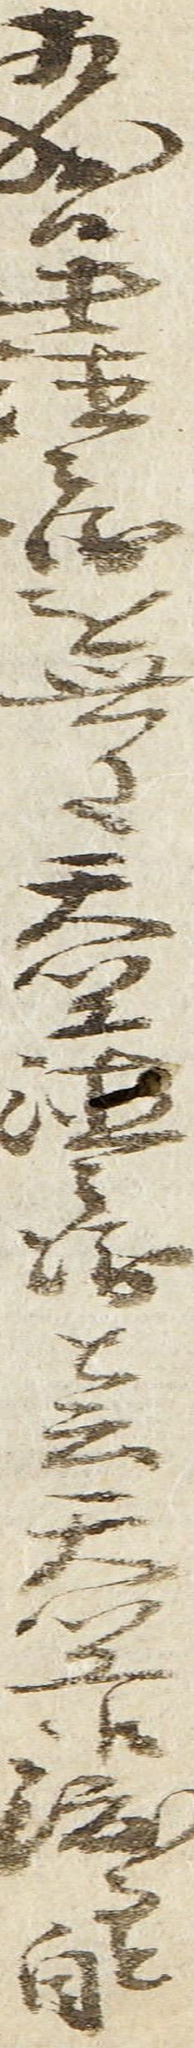相成候此徳兵衛を世に天竺徳兵衛と云天竺江渡ると自
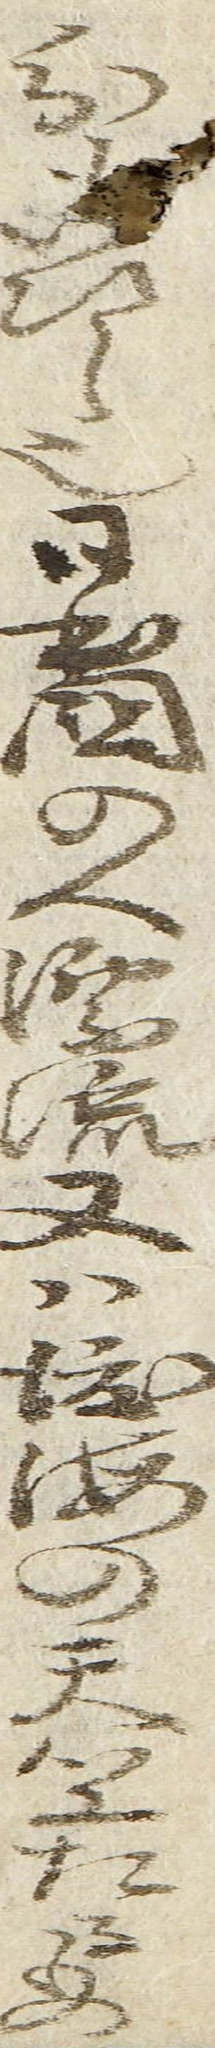分もいひし也日本国の人漂流又は渡海の天竺たるもの
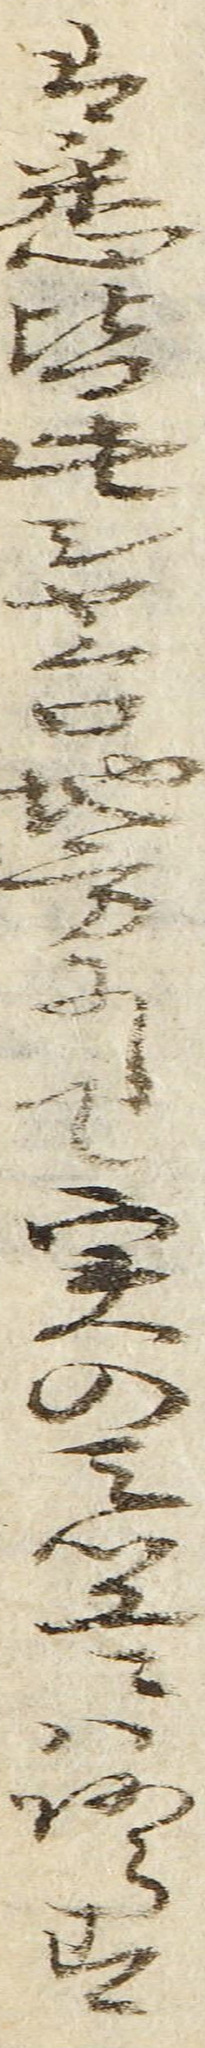は悉皆此シャムロ地方にして実の天竺にはあらす

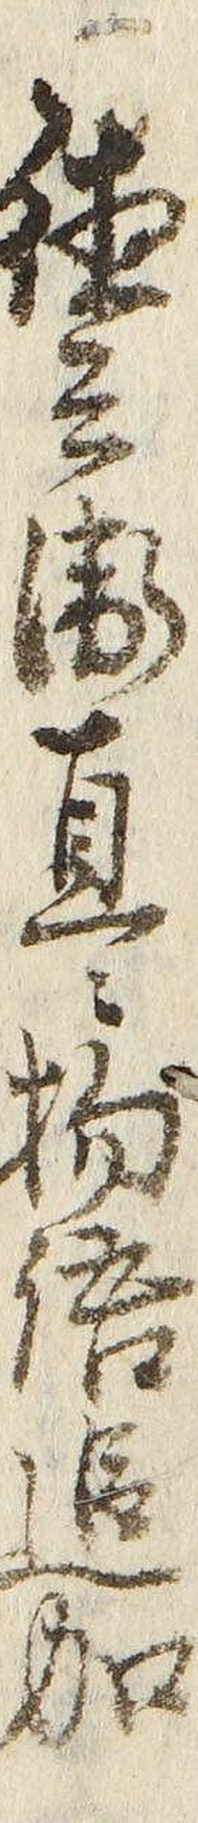徳兵衛直に物語追加
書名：漂流夢物語
